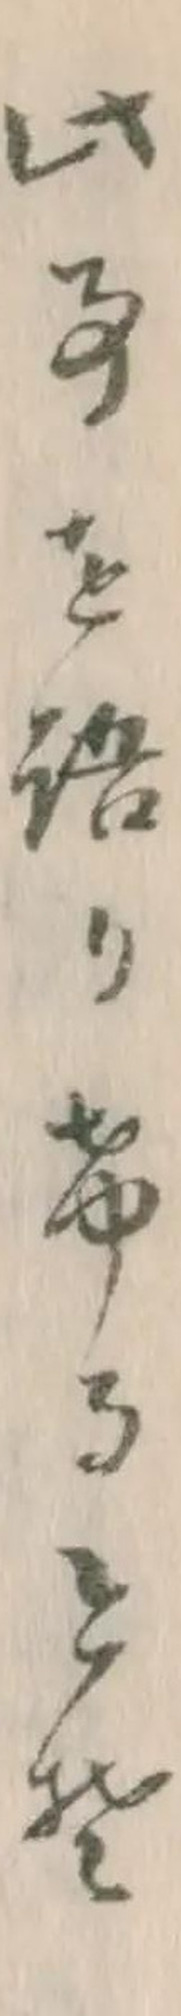此事を語りけるとそ
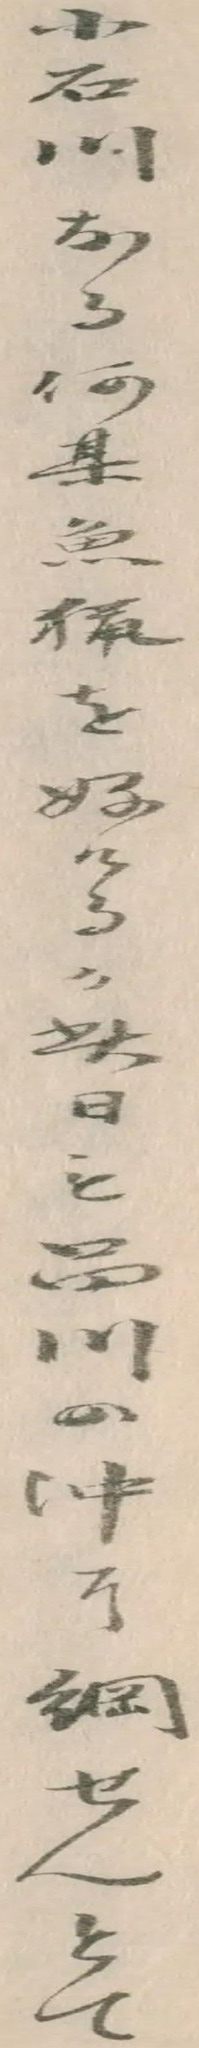小石川なる何某漁猟を好けるか此日も品川の沖に網せんとて
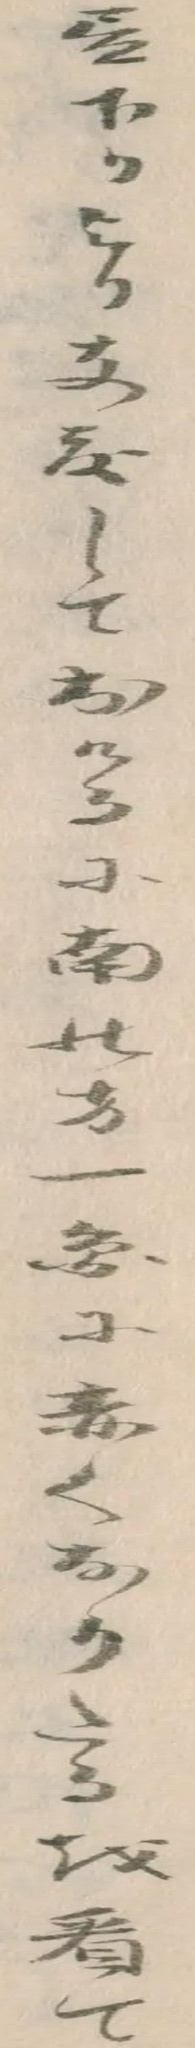昼下りより支度して出けるに南の方一円に赤くなりたるを看て
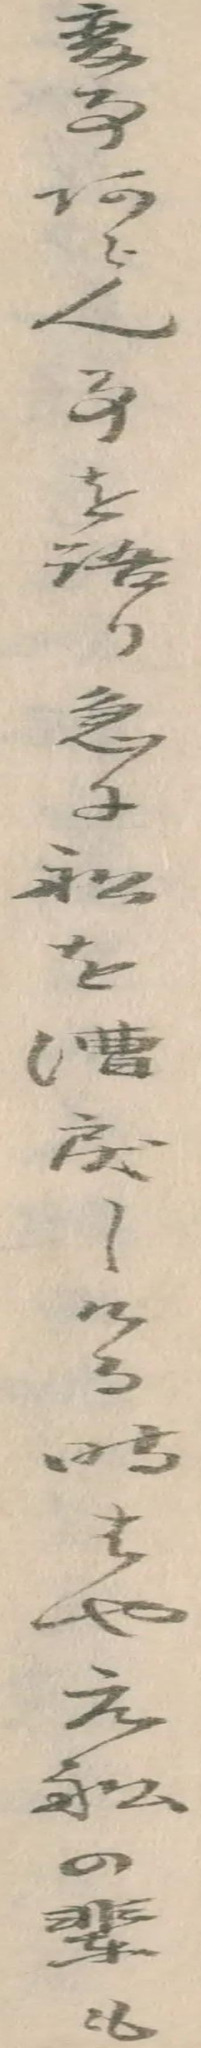変事あらん事を語り急に船を漕戻しける時はや元船の輩も

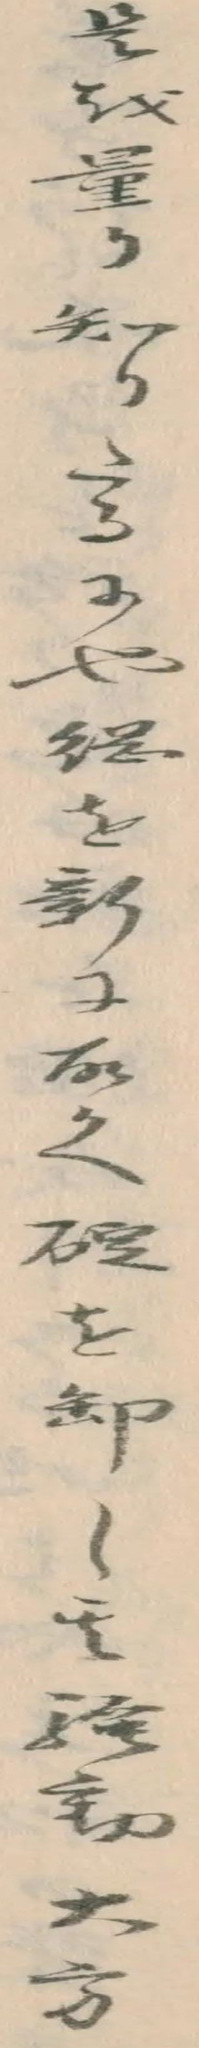是を量り知りたるにや綱を新に取かへ碇を卸し其騒動大方
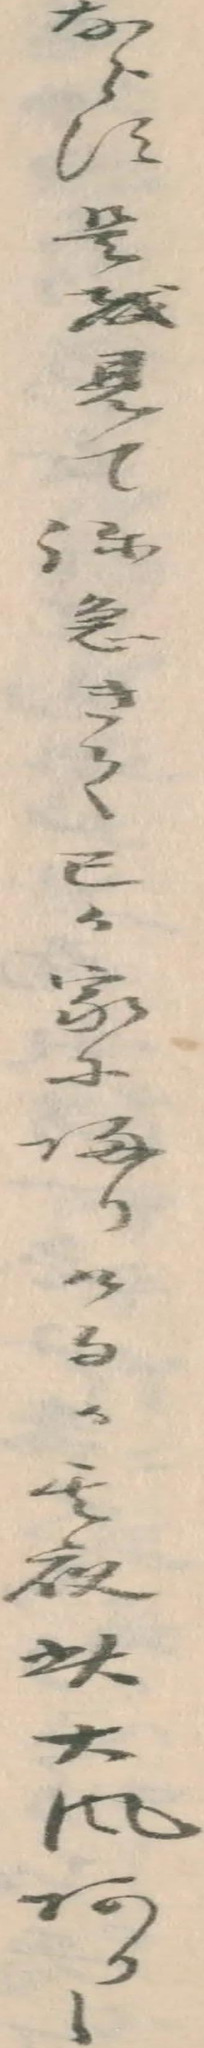ならす是を見て弥急きて己か家に帰りけるか其夜此大風ありし
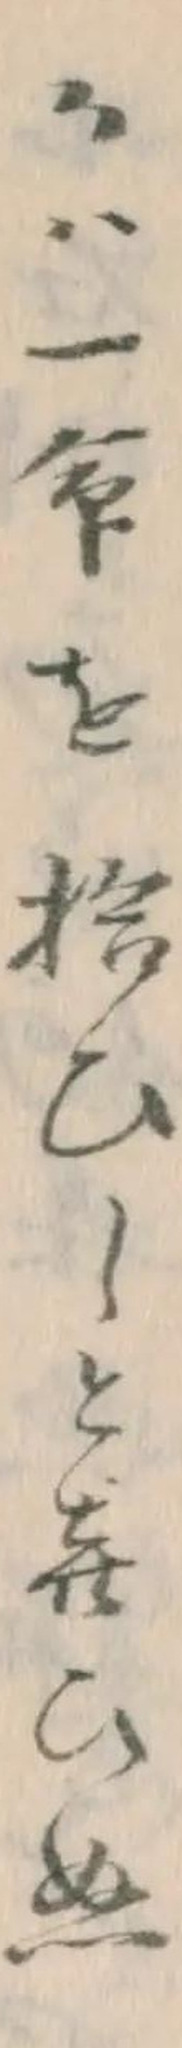かは一命を拾ひしと喜ひぬ
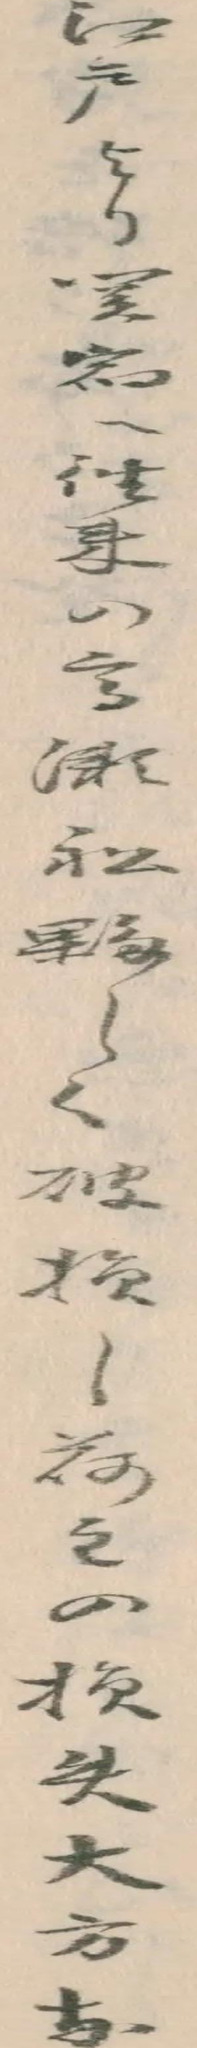江戸より関宿へ往来の高瀬船夥しく破損し荷主の損失大方な
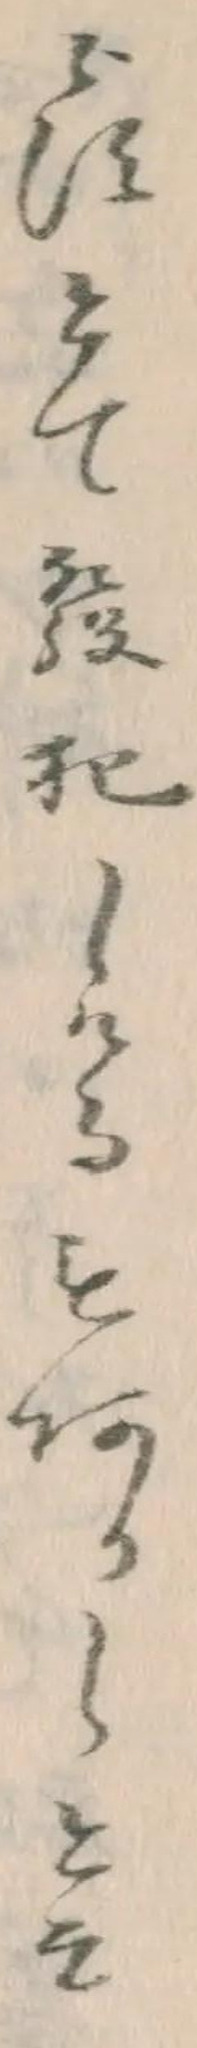らすとて発狂しけるもありしとそ
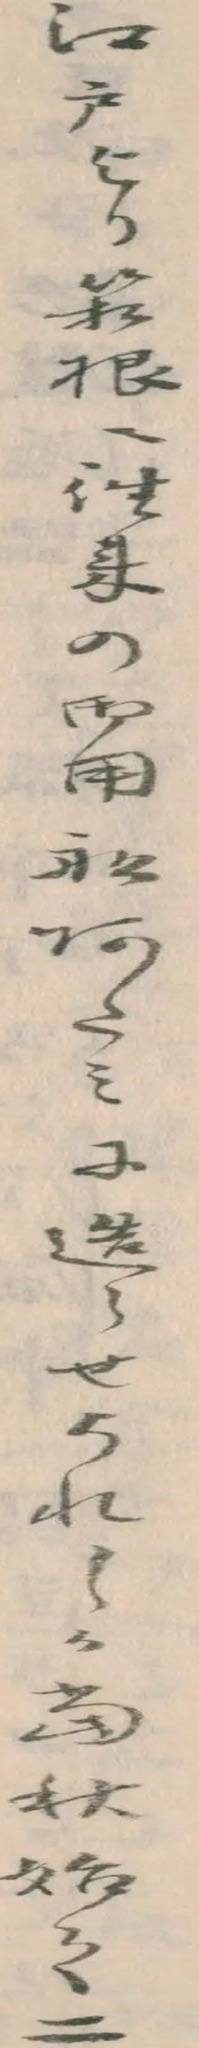江戸より箱根へ往来の御用船あたみに造らせられしか当秋始て二
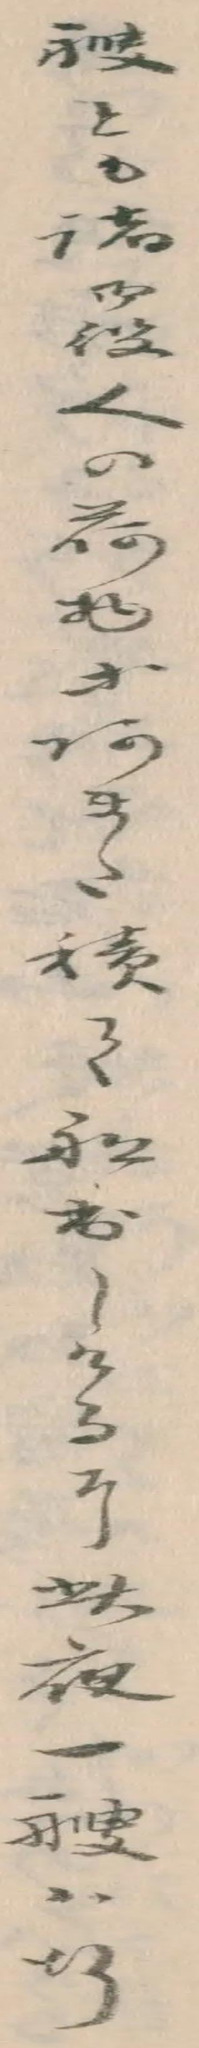艘とも諸御役人の荷物等あまた積て船出しけるに此夜一艘は行
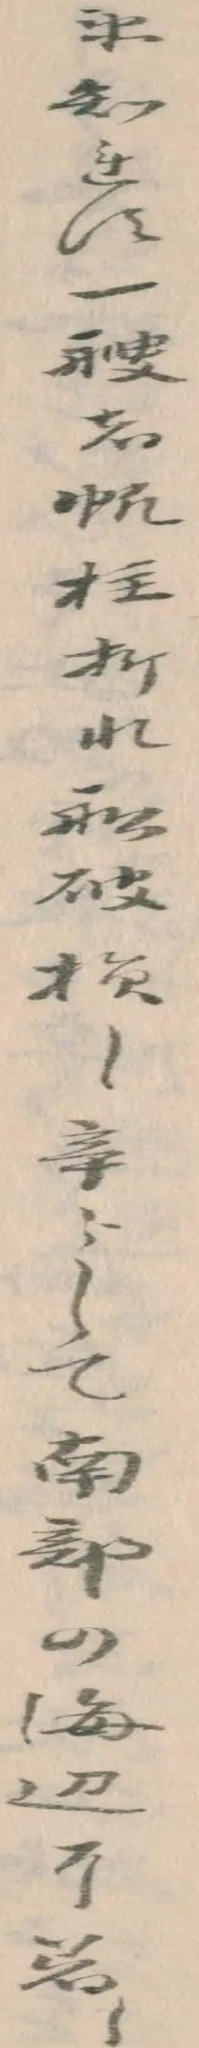ゑ知れす一艘は帆柱折れ船破損し辛うして南部の海辺に着し
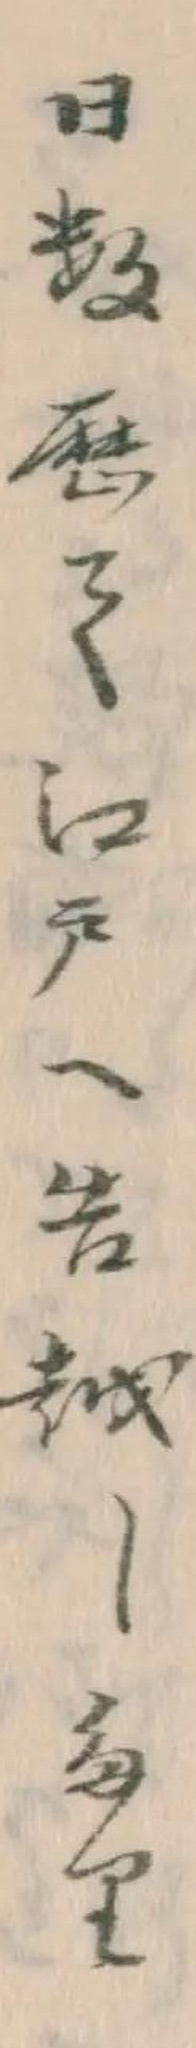日数歴て江戸へ告越したり
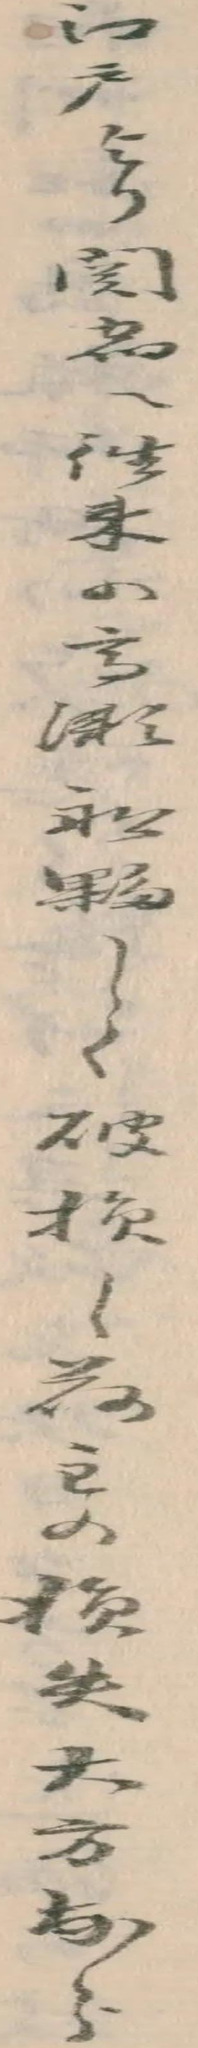江戸より関宿へ往来の高瀬船夥しく破損し荷主の損失大方なら
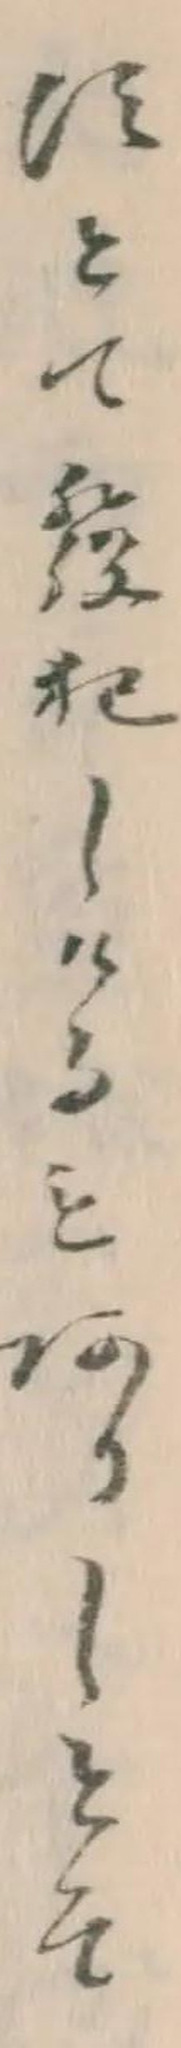すとて発狂しけるもありしとそ
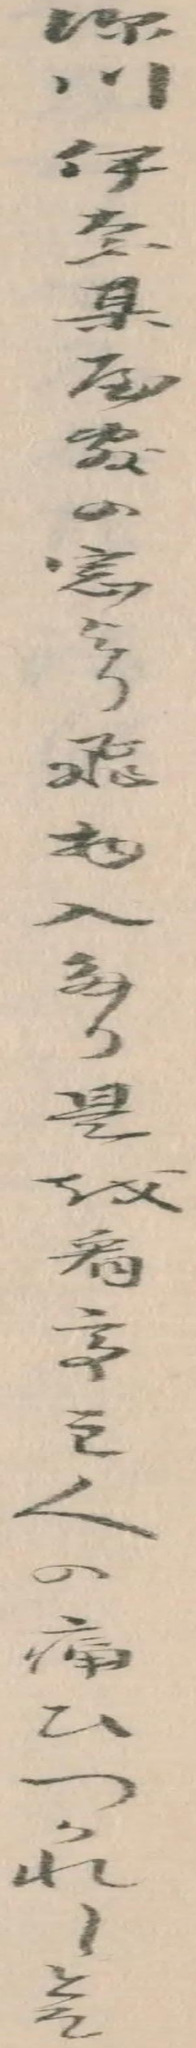深川伊奈某屋敷の窓より飛物入たり是を看て主人の痛ひつかれしとそ
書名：地災撮要. 巻10(地震之部) 上,下
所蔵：国立国会図書館 National Diet Library, JAPAN
